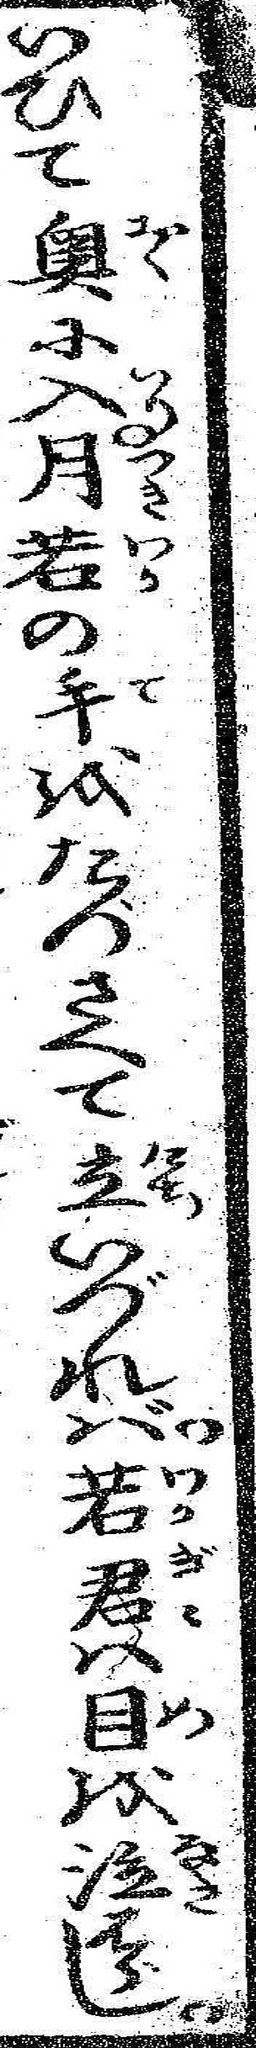いひて奥に入。月若の手をたづさへて立いづれば。若君は目を泣はらし。
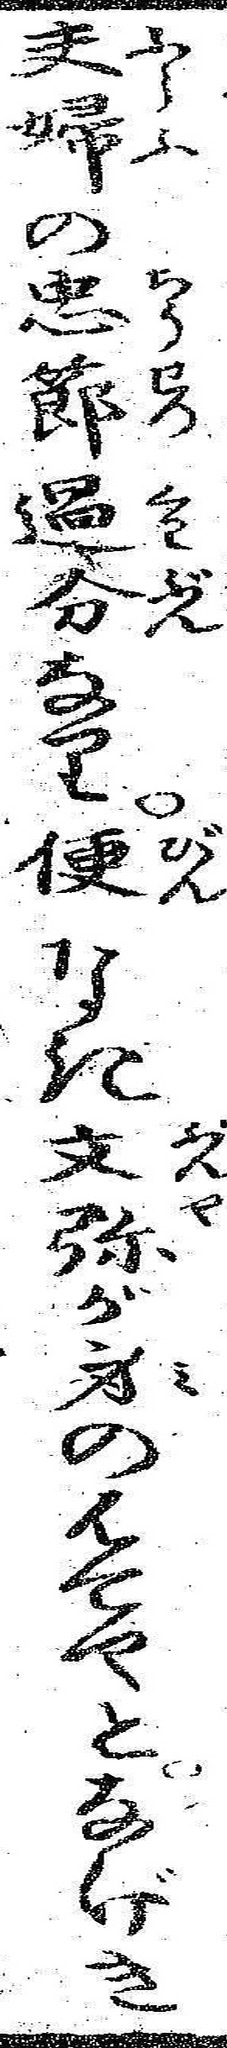夫婦の忠節過分なり。便なき文弥が身のはてやと。なげき
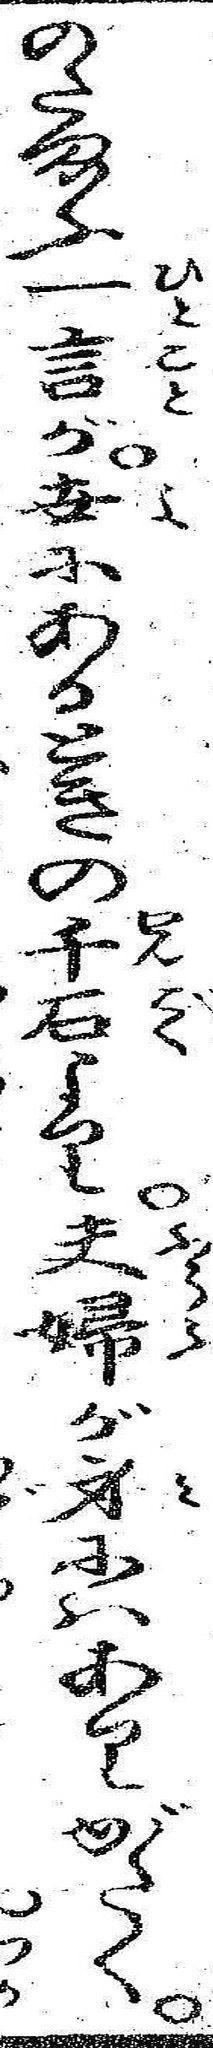のたまふ一言が。世にあるときの千石より。夫婦が身にはありがたく。
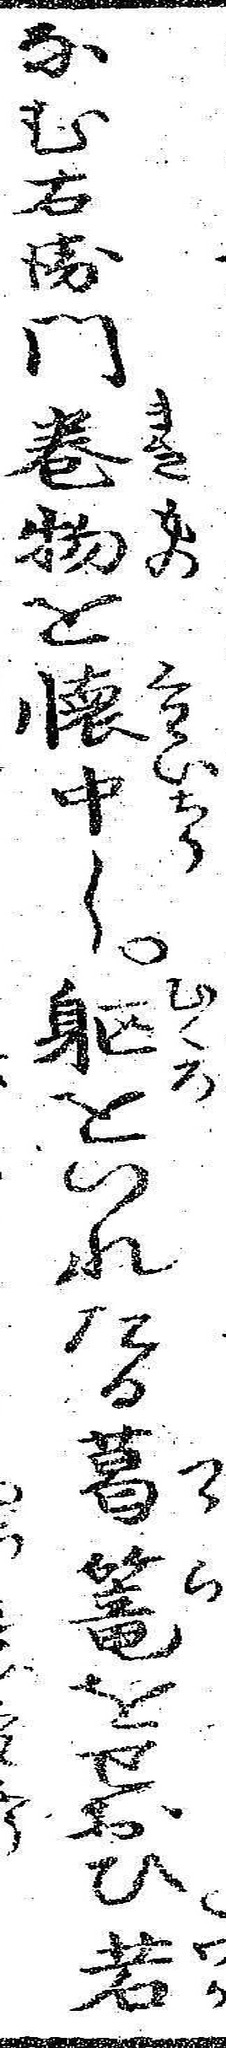なむ右衛門巻物を懐中し。躯をいれたる葛篭をせおひ。若
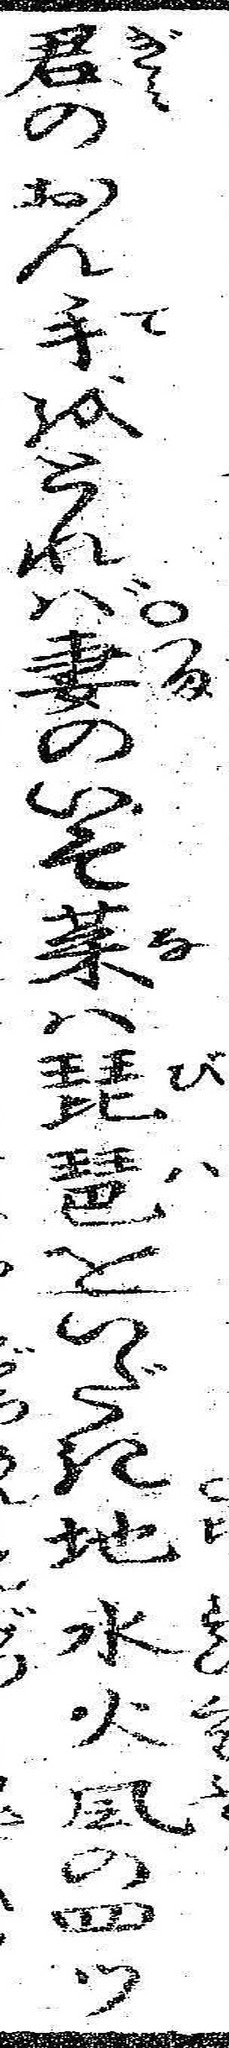君のおん手をとれば。妻のいそ菜は琵琶をいだき。地水火風の四ツ
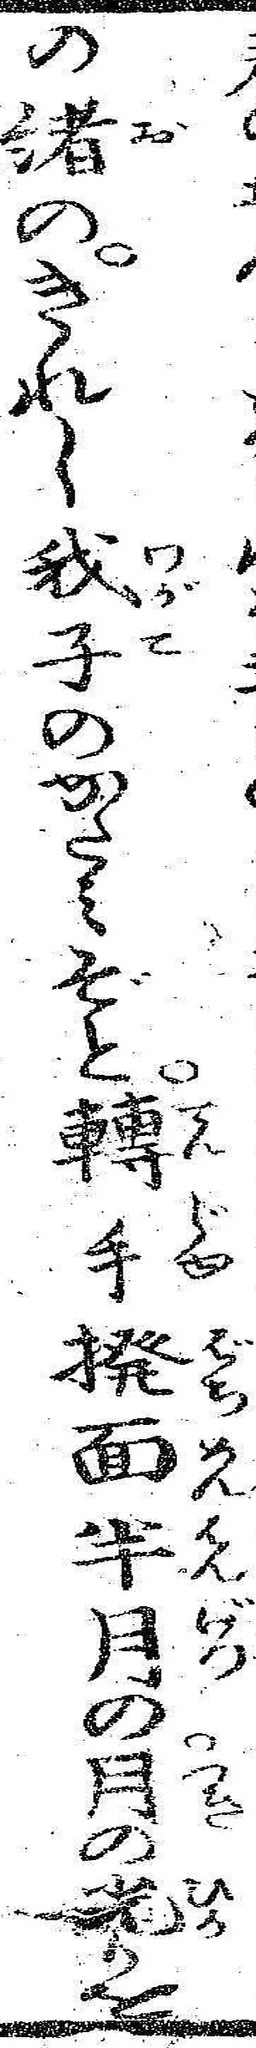の緒の。きれし我子のかたみぞと。転手撥面半月の。月の光りを
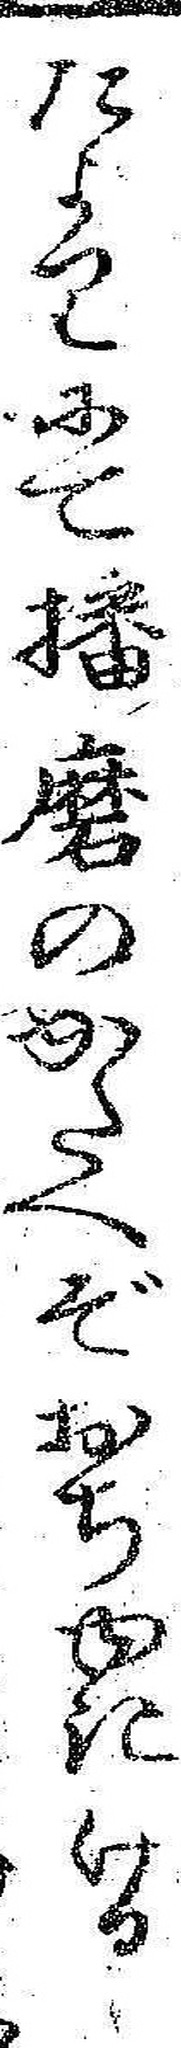たよりにて播磨のかたへぞおちゆきける
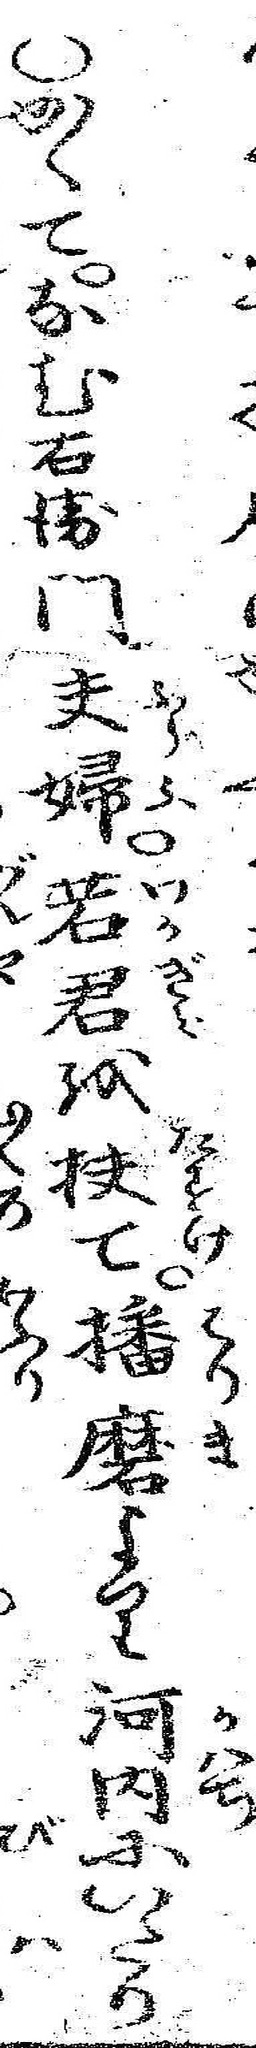○かくて。なむ右衛門夫婦。若君を扶て。播磨より河内にいたり
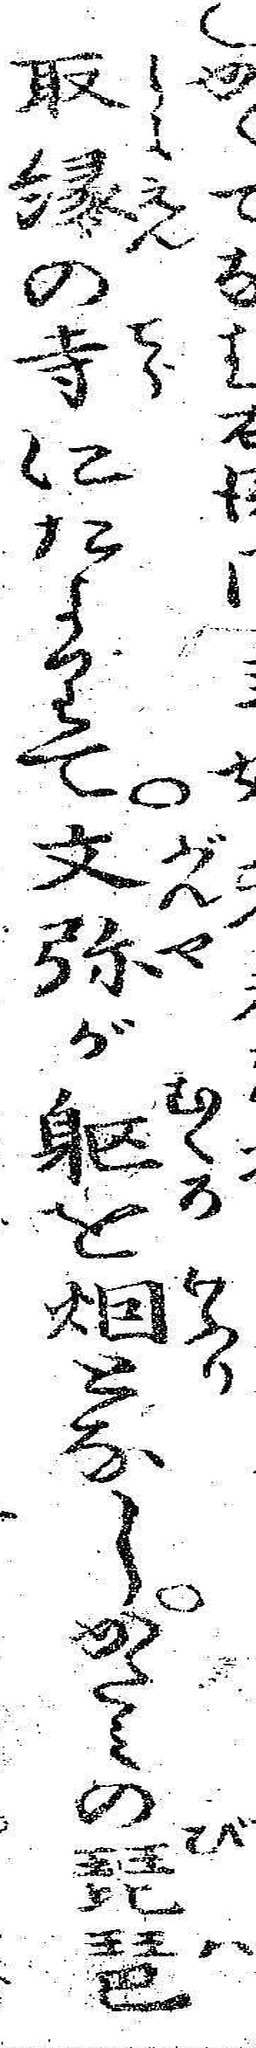取縁の寺にたよりて。文弥が躯を煙となし。かたみの琵琶
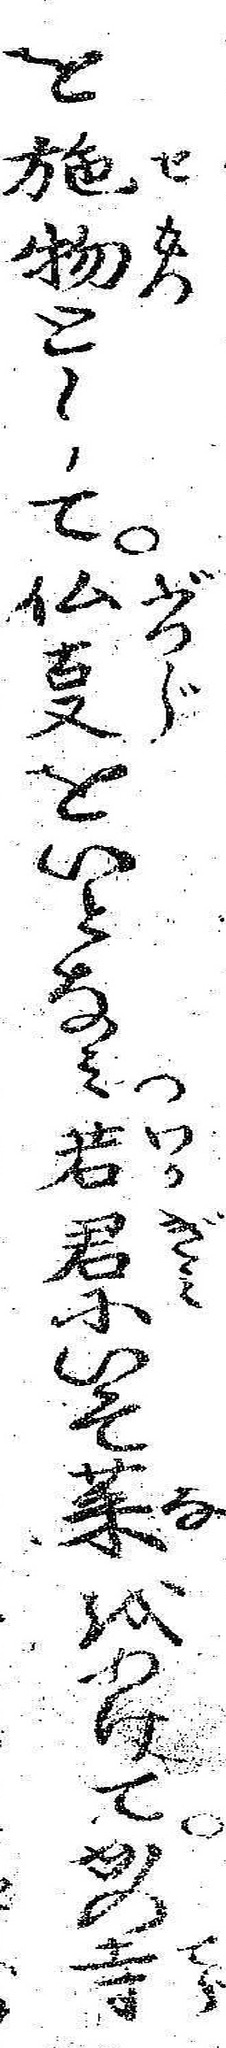を施物として。仏事をいとなみ。若君にいそ菜をつけて。かの寺
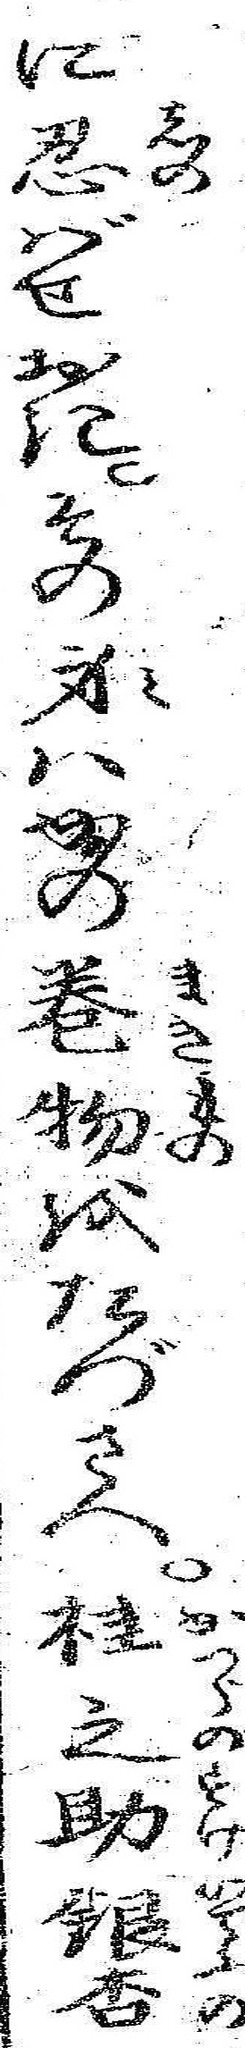に忍ばせおき。その身はかの巻物をたづさへ。桂之助銀杏

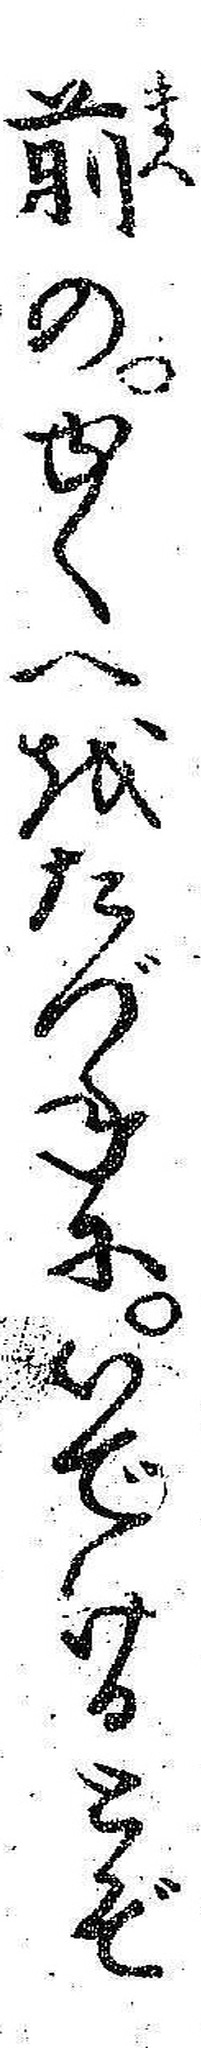前の。ゆくへをたづねに。いでけるとぞ
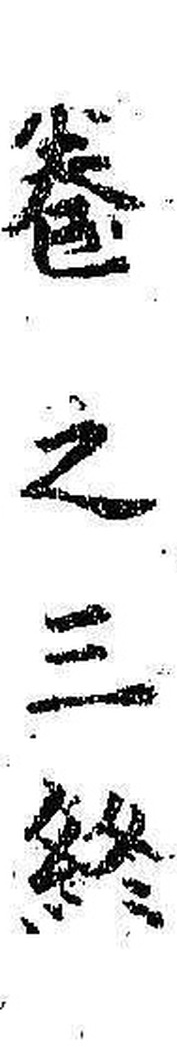巻之三終

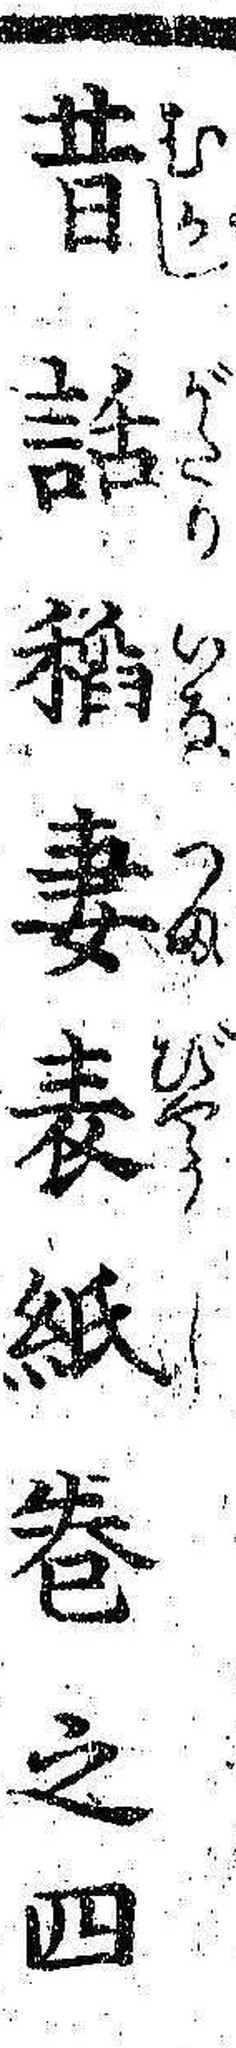昔話稲妻表紙巻之四
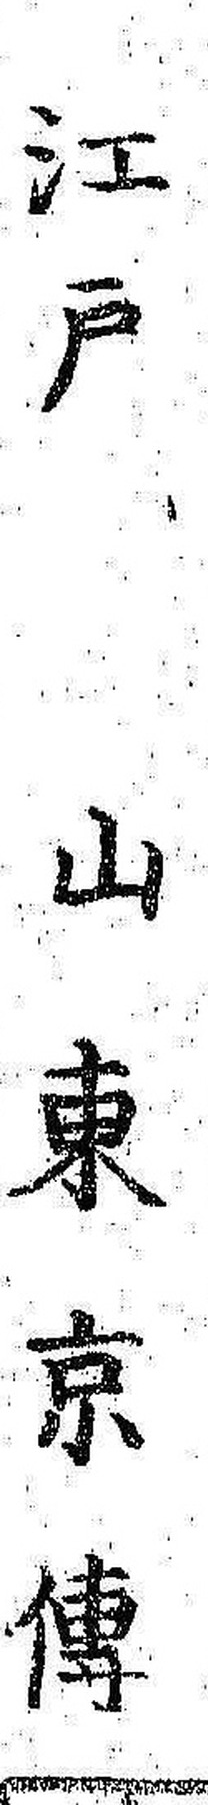江戸山東京伝編
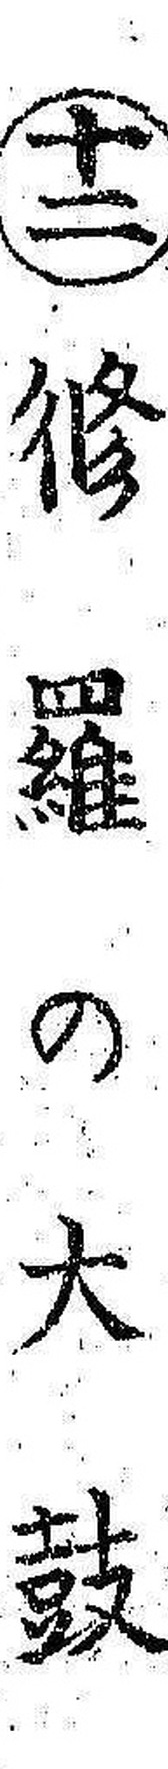十二修羅の大鼓
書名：昔話稲妻表紙
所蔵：国文学研究資料館
